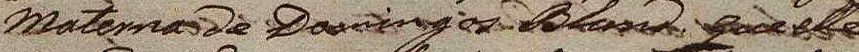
materna de Domingos Bland que elle
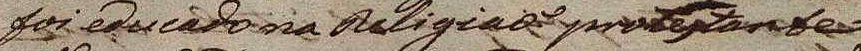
foi educado na Religiaõ protestante
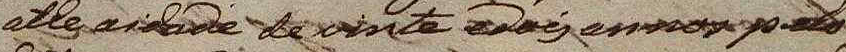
atte a idade de vinte e dois annos pelo
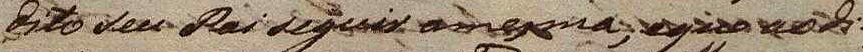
dito seu Pai seguir a mesma, e que ao di
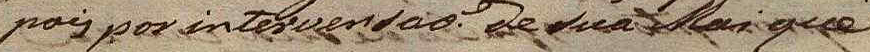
pois por intervensaõ de sua Mai que
